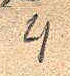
4
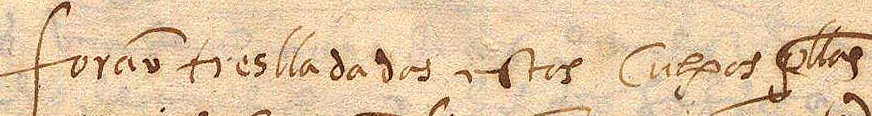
forão treslladadas estas culpas p̄llas
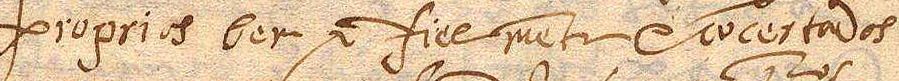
proprias bem e fielmēte e cōcertadas
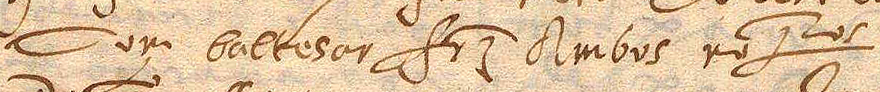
Com baltesar fr̄z Ambos notros
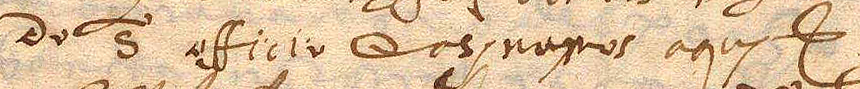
do sto officio e asjnamos aquj
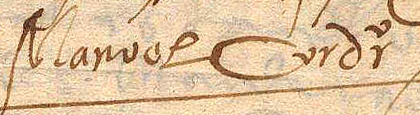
Manoel Cordro
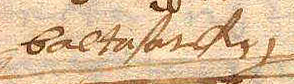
baltasar frz
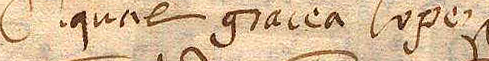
A qual gracea lopez
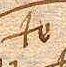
t̄e
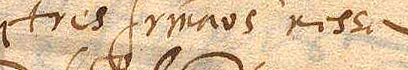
tres Jrmãos nessa
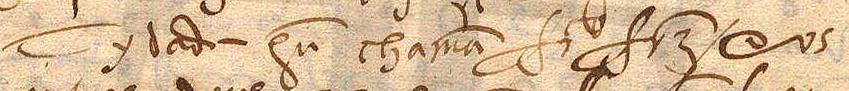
Cydade hū chamā frco frz̄ e os
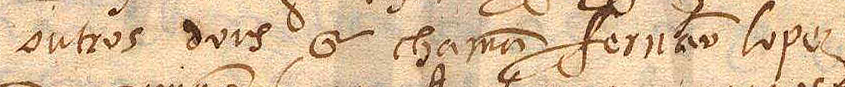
outros dous se chamā fernão lopez
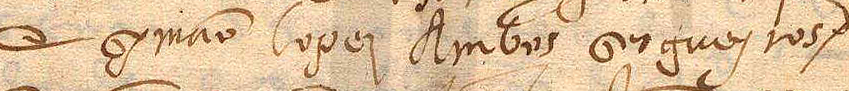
e symão lopez Ambos serguejros /
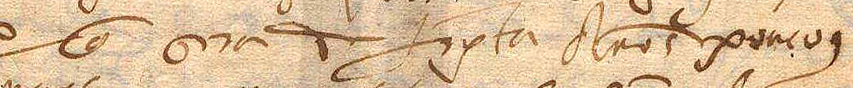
e q̄ sera de trȳta Anōs pouco
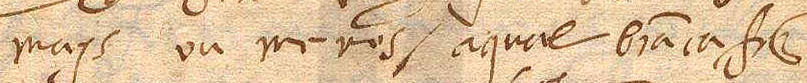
majs ou menos / a qual brāca frz̄
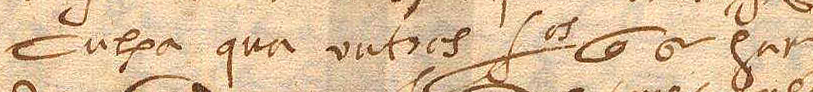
culpa qua outras fas q̄ se ham
